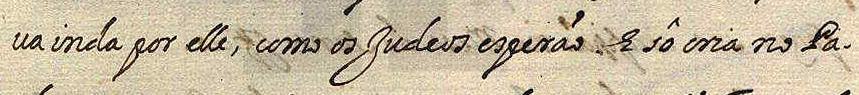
ua inda por elle, como os Judeos esperão E sô cria no Pa
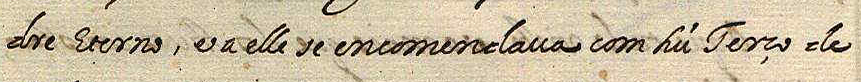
dre Eterno, e a elle se encomendaua com hū Terço de
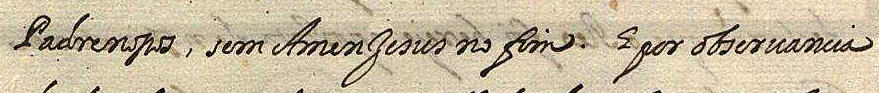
Padre nossos, sem Amen Jesus no fim. E por obseruancia
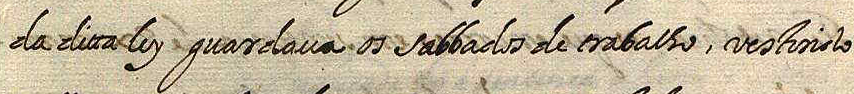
da ditta ley guardaua os sabbados de trabalho, vestindo
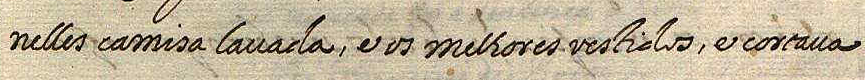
nelles camisa lauada, e os melhores vestidos, e cortaua
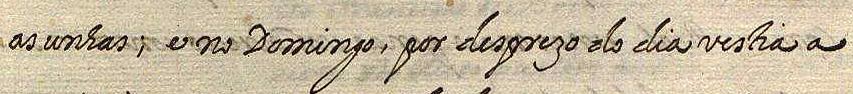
as unhas; e no Domingo, por desprezo do dia vestia a
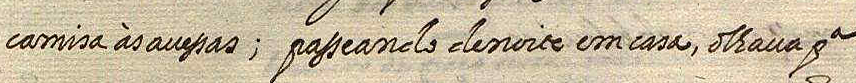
camisa às auessas; passeando de noite em casa, olhaua pa
